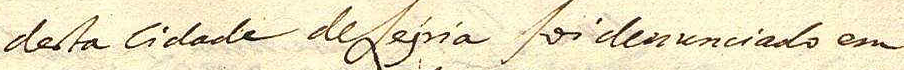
desta cidade de Lejria foi denunciado em
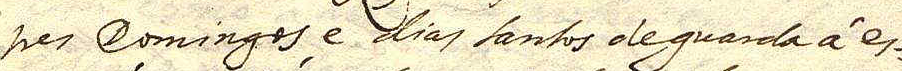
tres Domingos, e dias santos de guarda á es
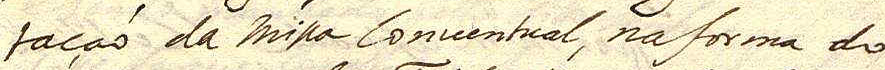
tação da missa Conuentual, na forma do
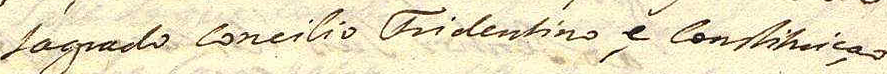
sagrado concilio Tridentino, e constituiçaõ
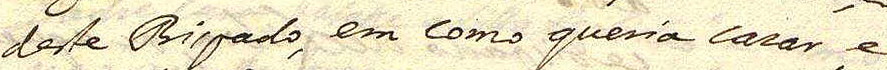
deste Bispado, em como queria cazar, e
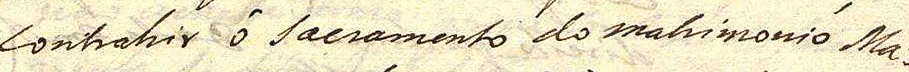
contrahir ó sacramento do matrimonio Ma
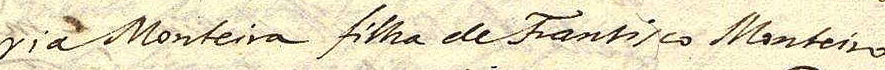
ria Monteira filha de Francisco Monteiro
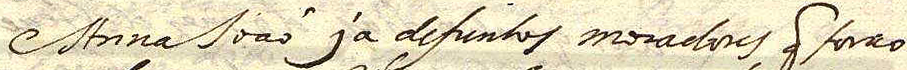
e Anna Joaõ ja defuntos moradores, q̄ foraõ
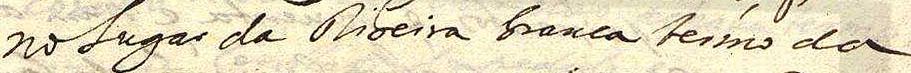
no Lugar da Ribeira branca termo da
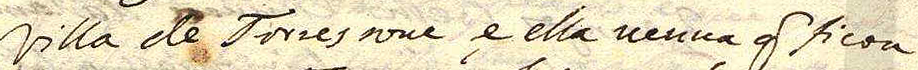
villa de Torres noua, e ella ueuua q̄ ficou
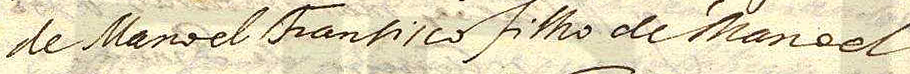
de Manoel Francisco filho de Manoel
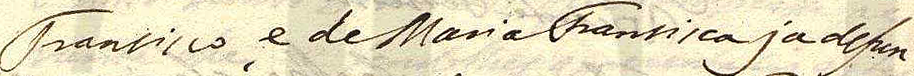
Francisco, e de Maria Francisca ja defun
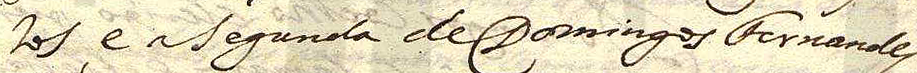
tos, e a segunda de Domingos Fernandes,
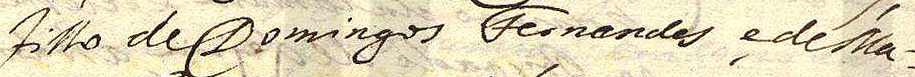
filho de Domingos Fernandes, e de Ma
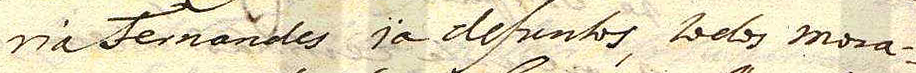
ria Fernandes ia defuntos, todos mora
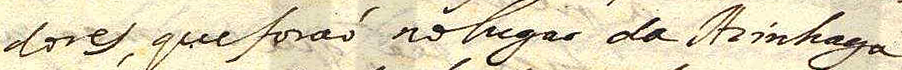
dores, que foraõ no lugar da Azinhaga
